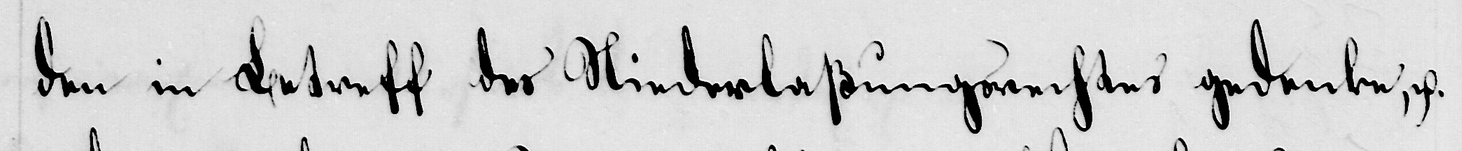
den in Betreff des Niederlaßungsrechtes gedenke, u.
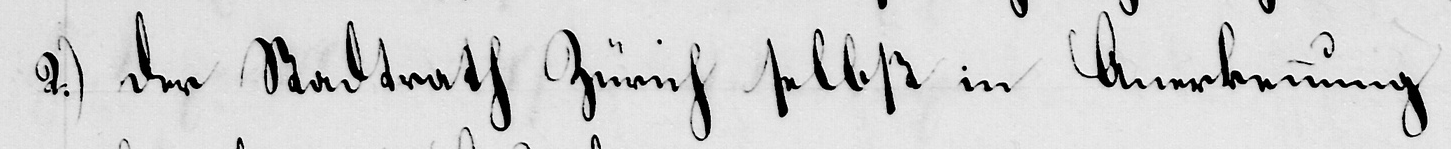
2.) der Stadtrath Zürich selbst in Anerkennung
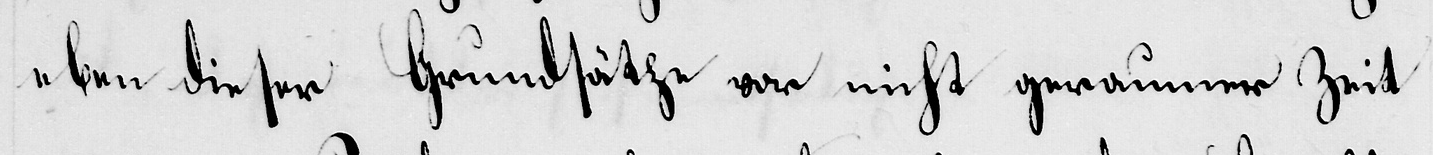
eben dieser Grundsätze vor nicht geraumer Zeit
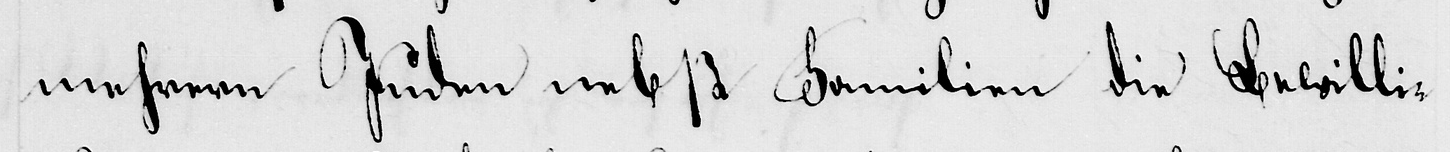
mehrern Juden nebst Familien die Bewilli¬
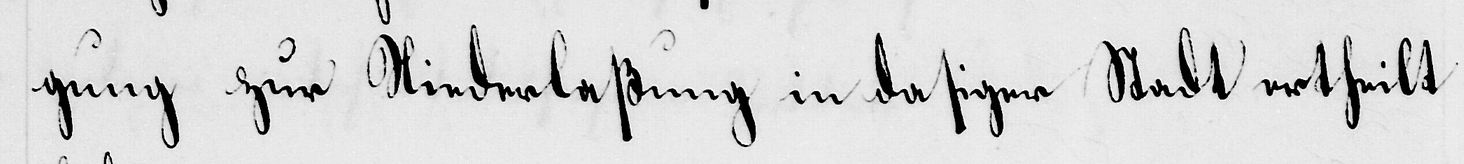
gung zur Niederlaßung in dasiger Stadt ertheilt
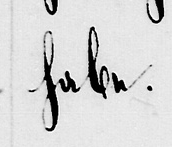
habe.
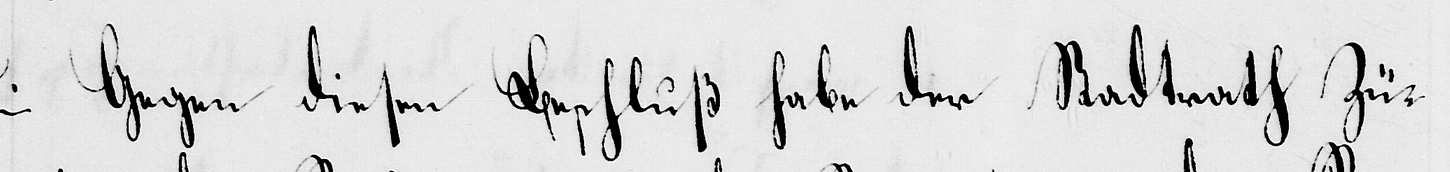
Gegen diesen Beschluß habe der Stadtrath Zü¬
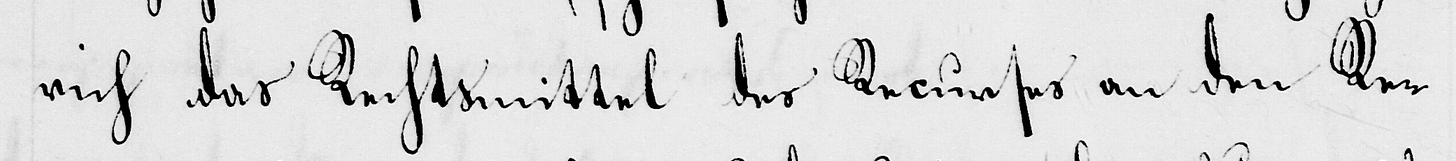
rich das Rechtsmittel des Recurses an den Re¬
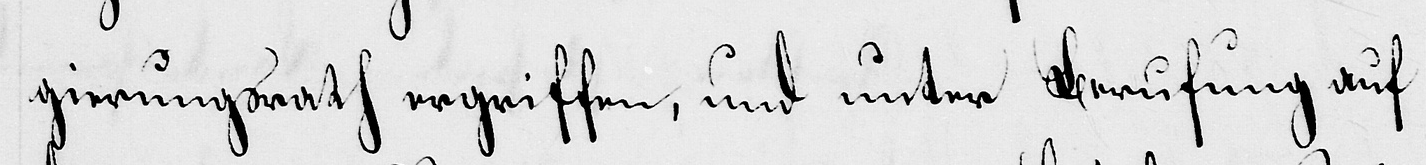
gierungsrath ergriffen, und unter Berufung auf
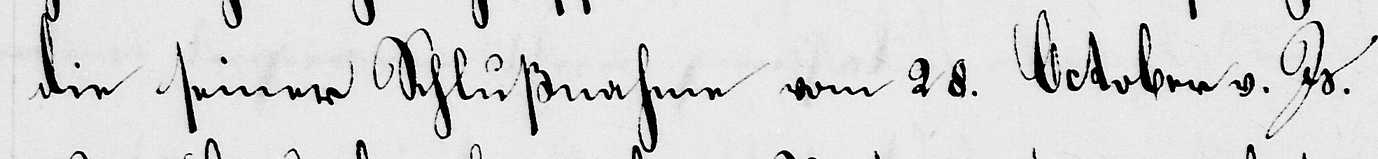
die seiner Schlußnahme vom 28. October v. Js.
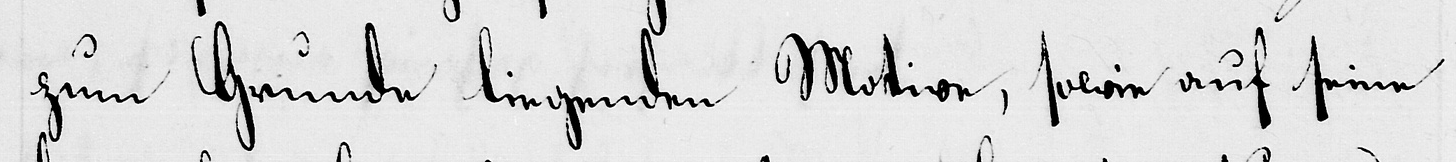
zum Grunde liegenden Motive, sowie auf seine
